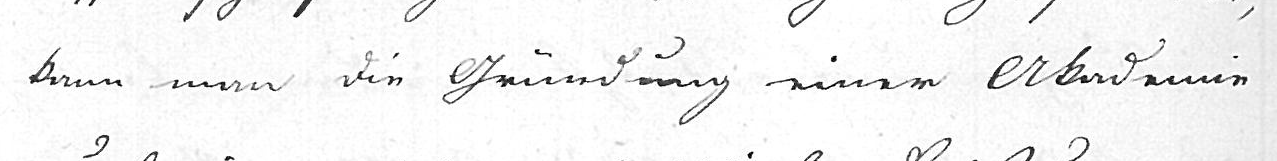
kann man die Gründung einer Akademie
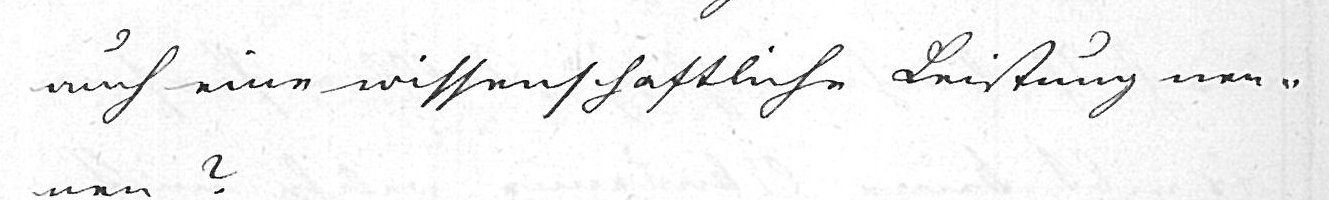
auch eine wissenschaftliche Leistung nen-
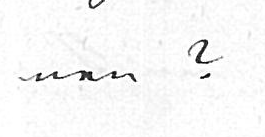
nen?
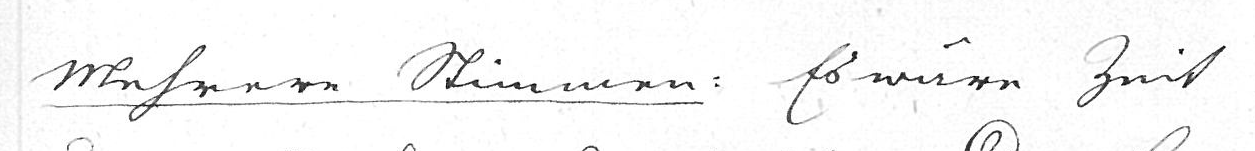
Mehrere Stimmen: Es wäre Zeit
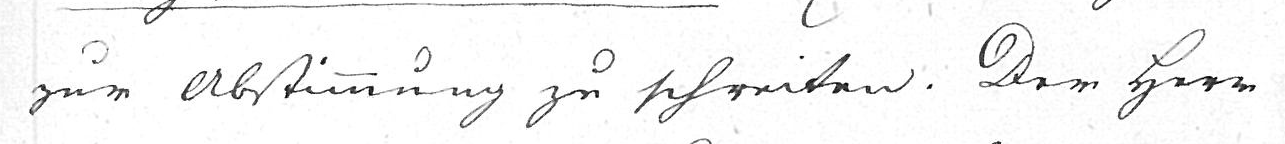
zur Abstimmung zu schreiten. Der Herr
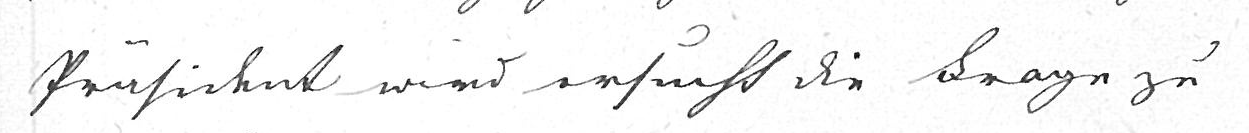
Präsident wird ersucht die Frage zu
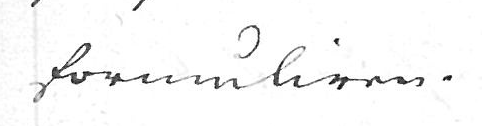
formulieren.
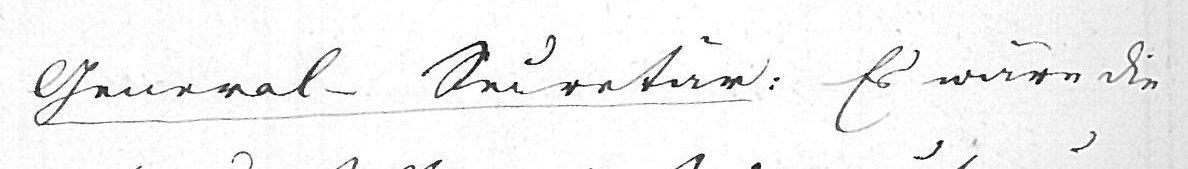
General-Secetär: Es wäre die
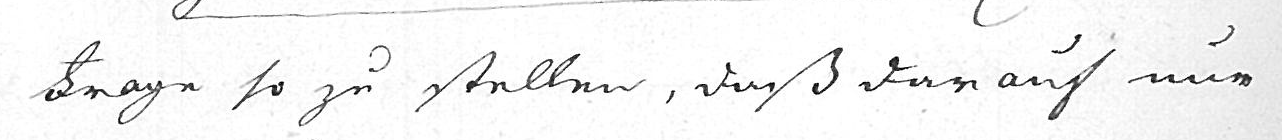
Frage so zu stellen, daß darauf nur
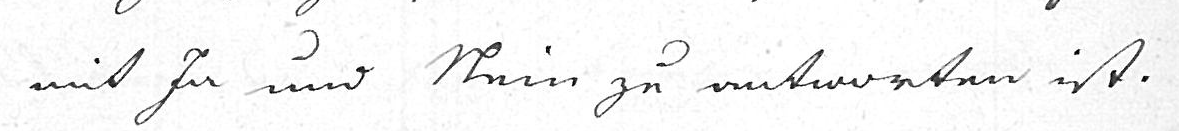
mit Ja und Nein zu antworten ist.
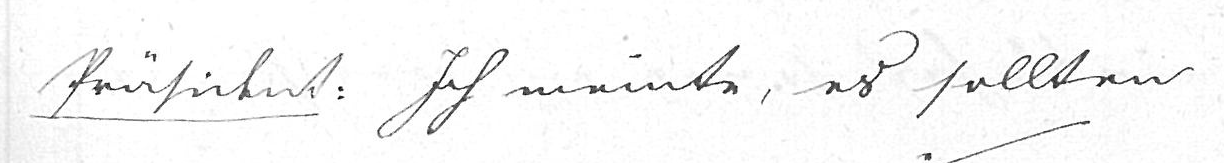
Präsident: Ich meinte, es sollten
